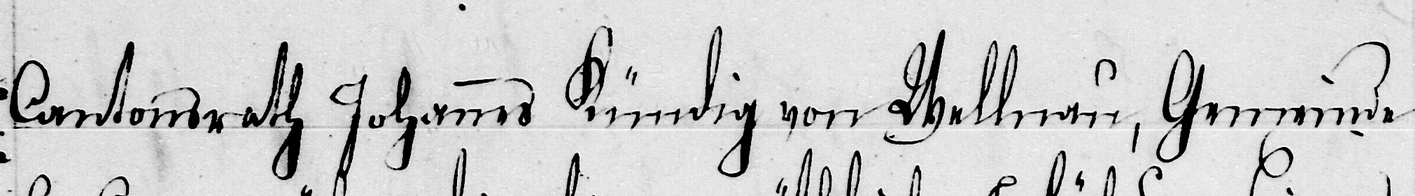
Cantonsrath Johannes Kündig von Wellnau, Gemeinde
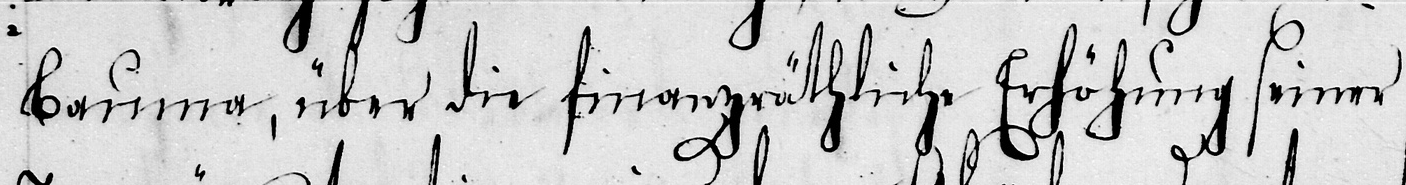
Bauma, über die finanzräthliche Erhöhung seiner
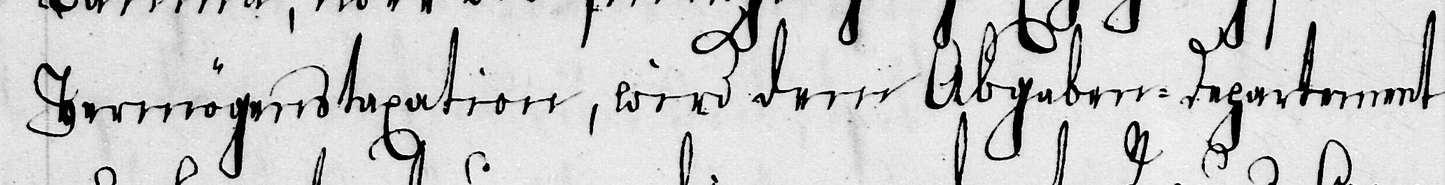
Vermögenstaxation, wird dem Abgaben-Departement
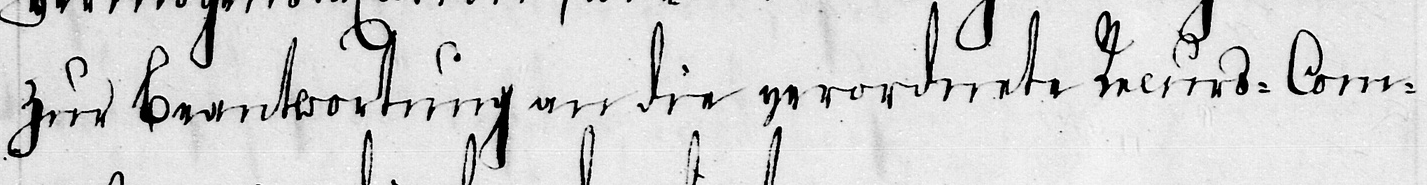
zur Beantwortung an die verordnete Recurs-Com¬
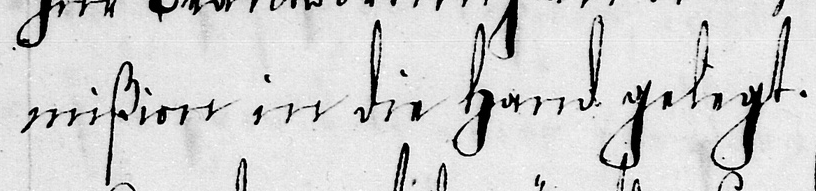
mißion in die Hand gelegt.
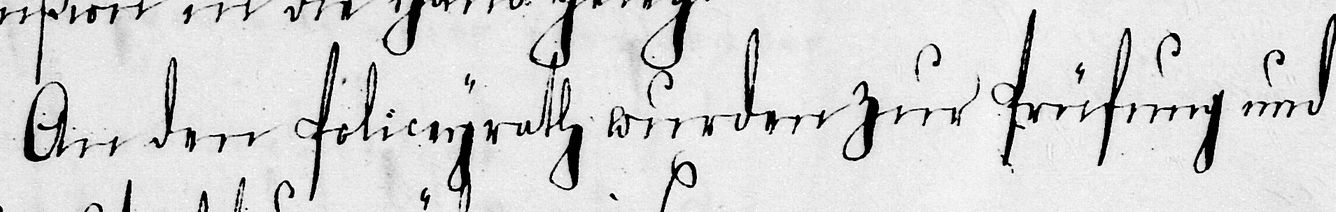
An den Policeyrath wurden zur Prüfung und
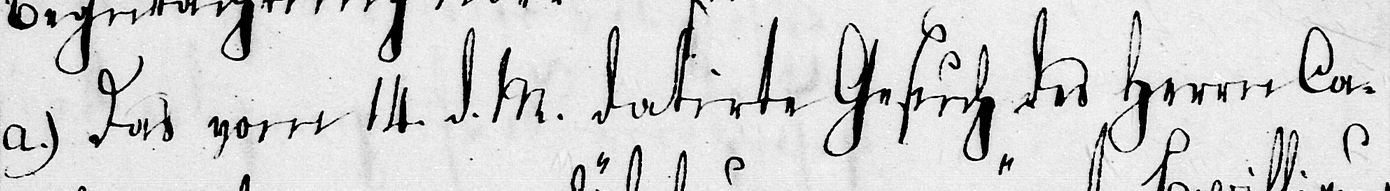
a.) Das vom 14. d. M. datirte Gesuch des Herrn Ca¬
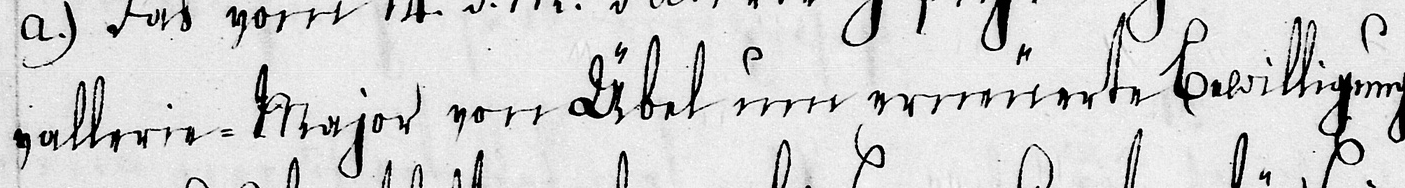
vallerie-Major von Übel um erneuerte Bewilligung
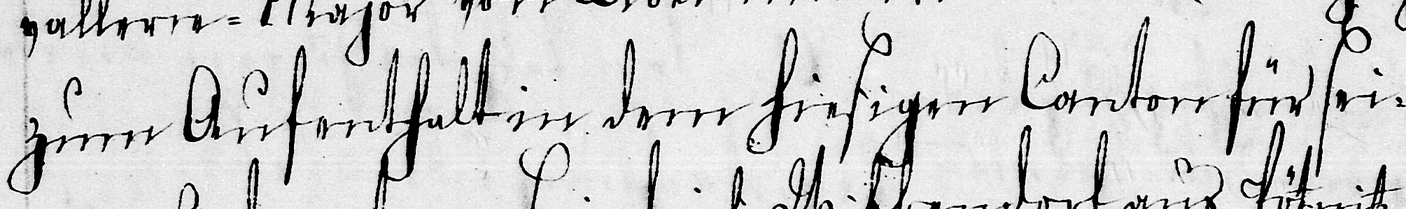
zum Aufenthalt in dem hiesigen Canton für sei¬
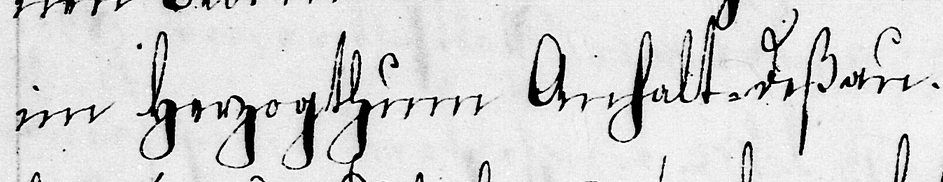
im Herzogthum Anhalt-Deßau.
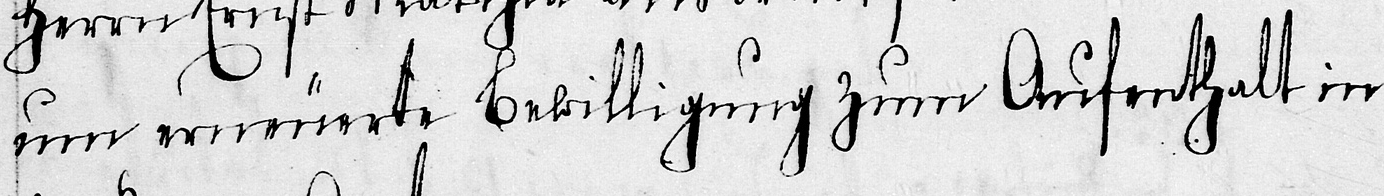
um erneuerte Bewilligung zum Aufenthalt im
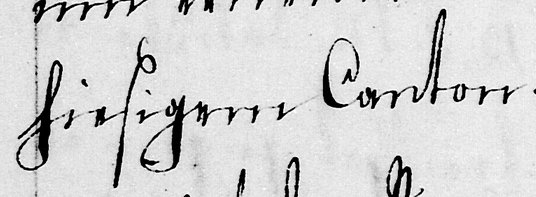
hiesigen Canton.
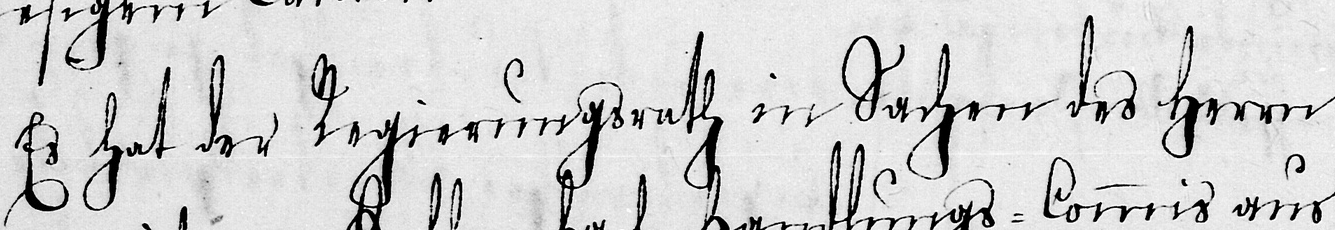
Es hat der Regierungsrath in Sachen des Herrn
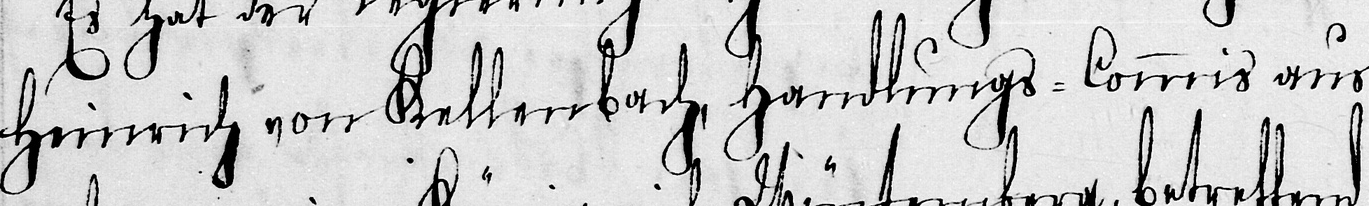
Heinrich von Kellenbach, Handlungs-Commis aus
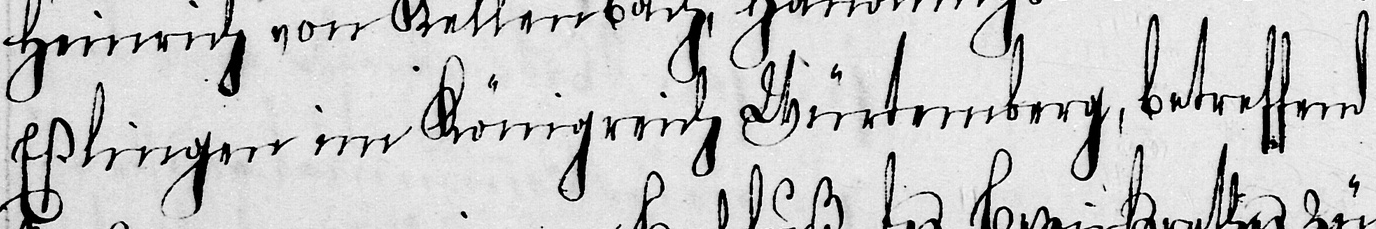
Eßlingen im Königreich Würtemberg, betreffend
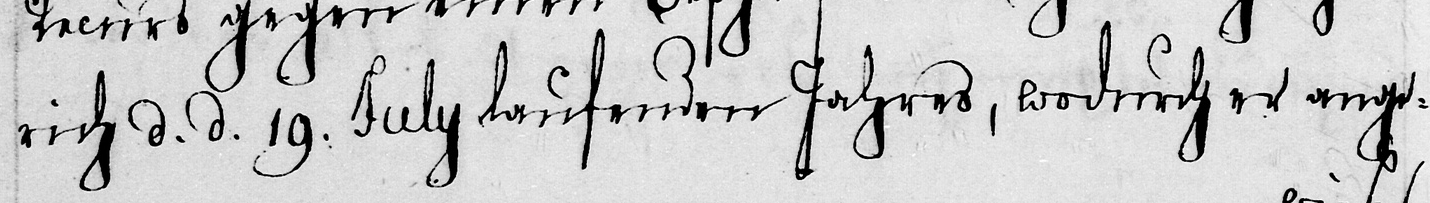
rich d. d. 19. July laufenden Jahres, wodurch er ange-
